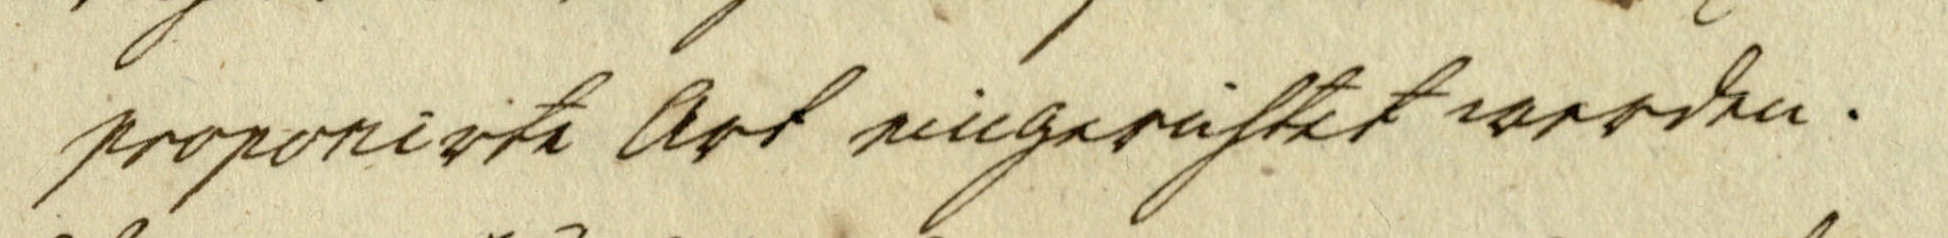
proponirte Art eingerichtet werden.
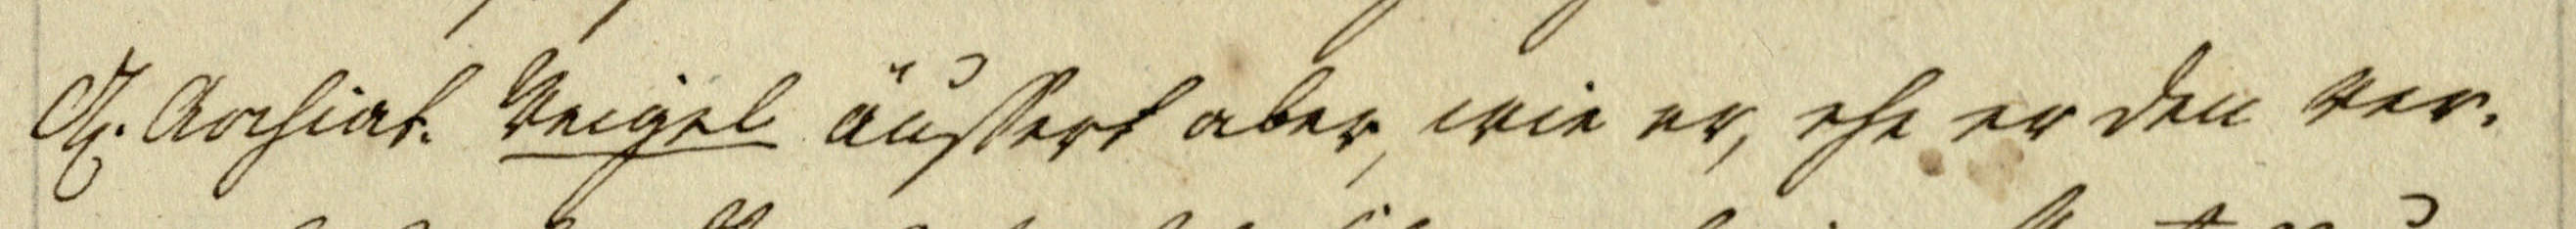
dh. Archiat. Weigel äussert aber wie er, ehe er den ver¬
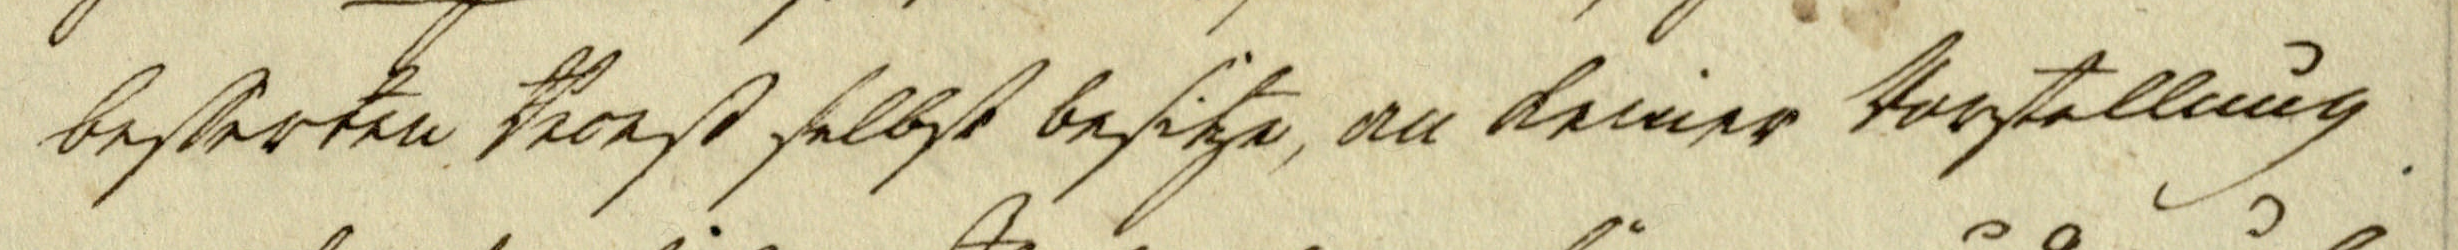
besserten Receß selbst besitze, an keiner Vorstellung
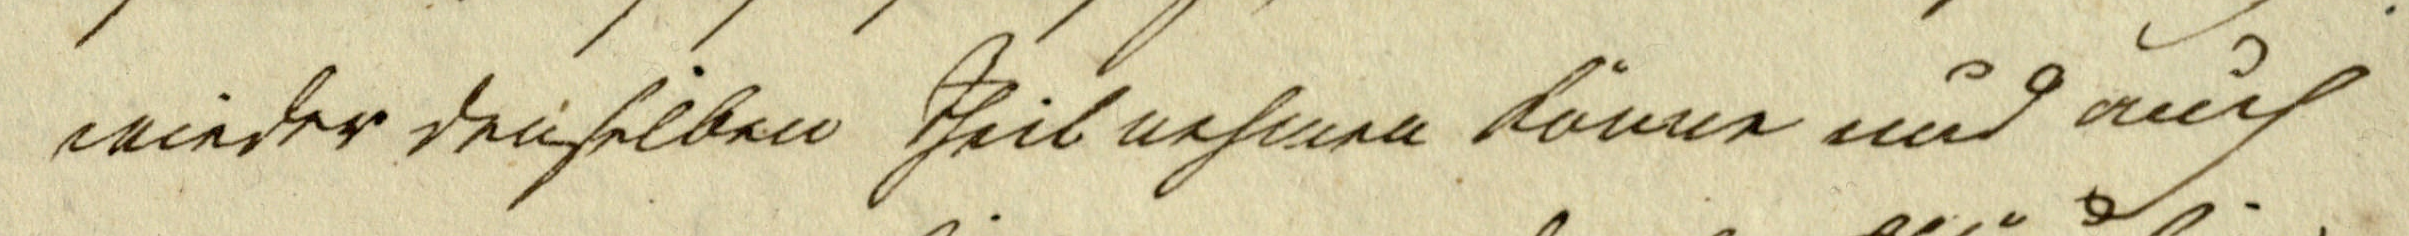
wieder denselben Theil nehmen könne und auch
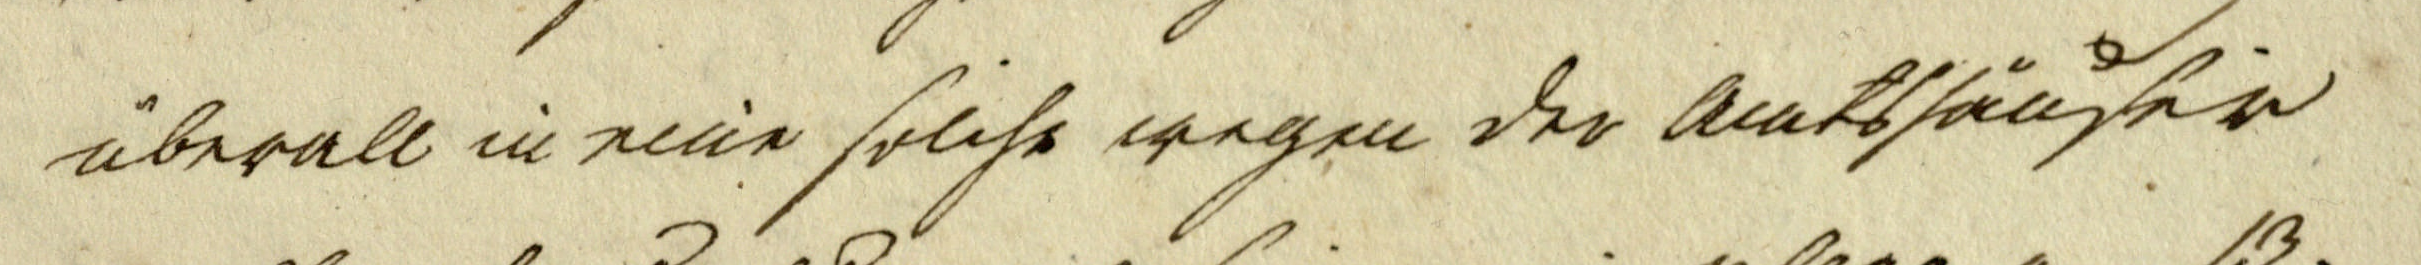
überall in eine solche wegen der Amtshäuser
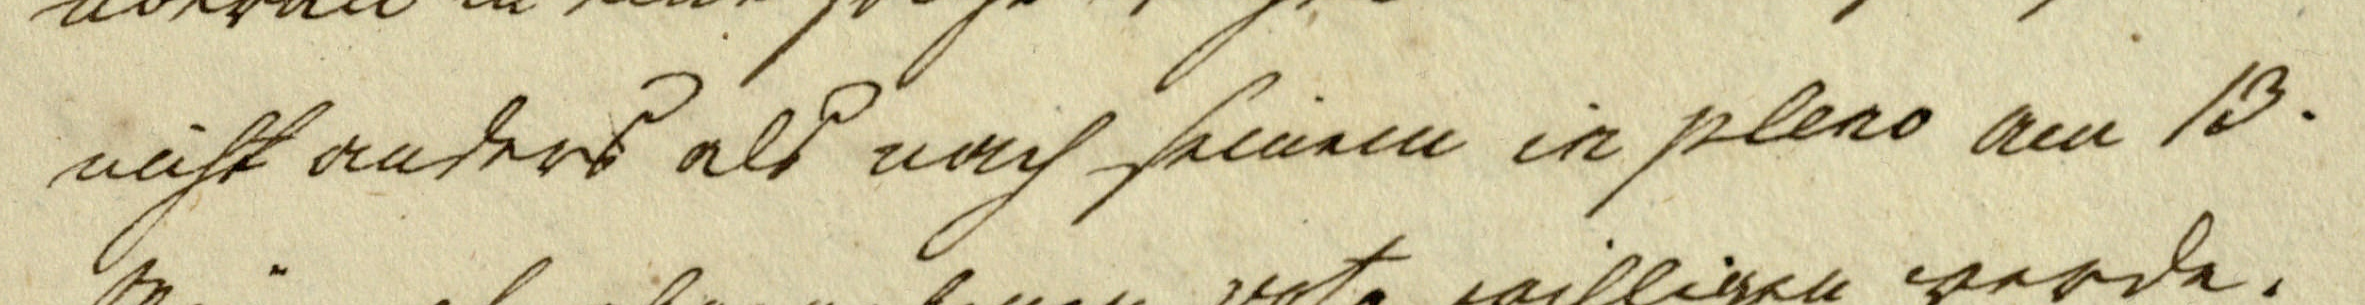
nicht anders als nach seinem in pleno am 13.
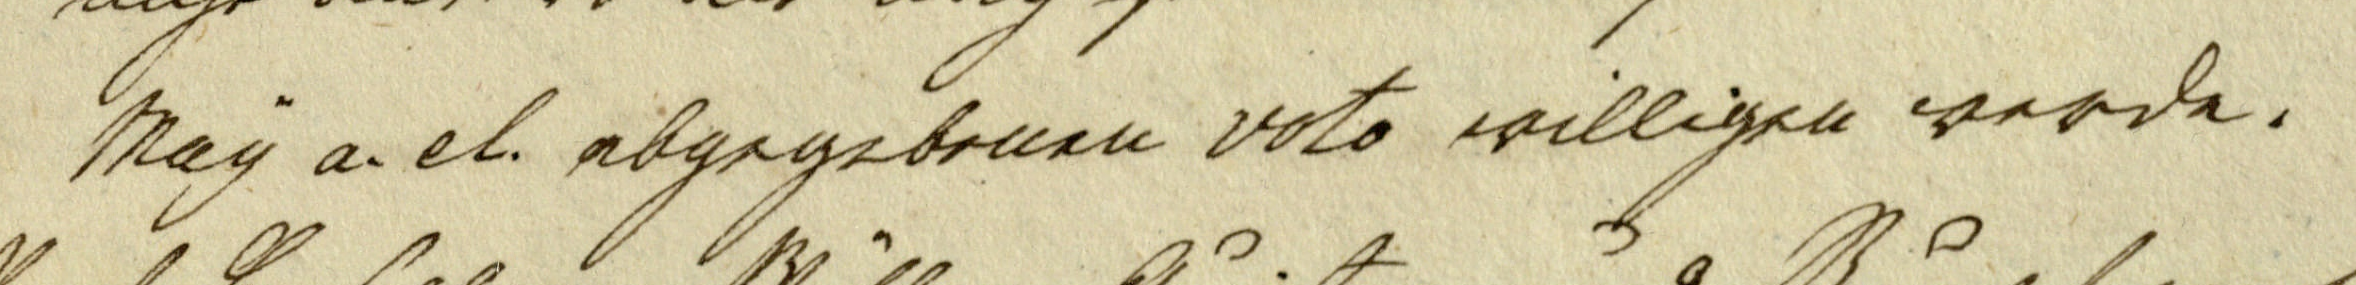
Maÿ a. el. abgegebenen voto willigen werde.
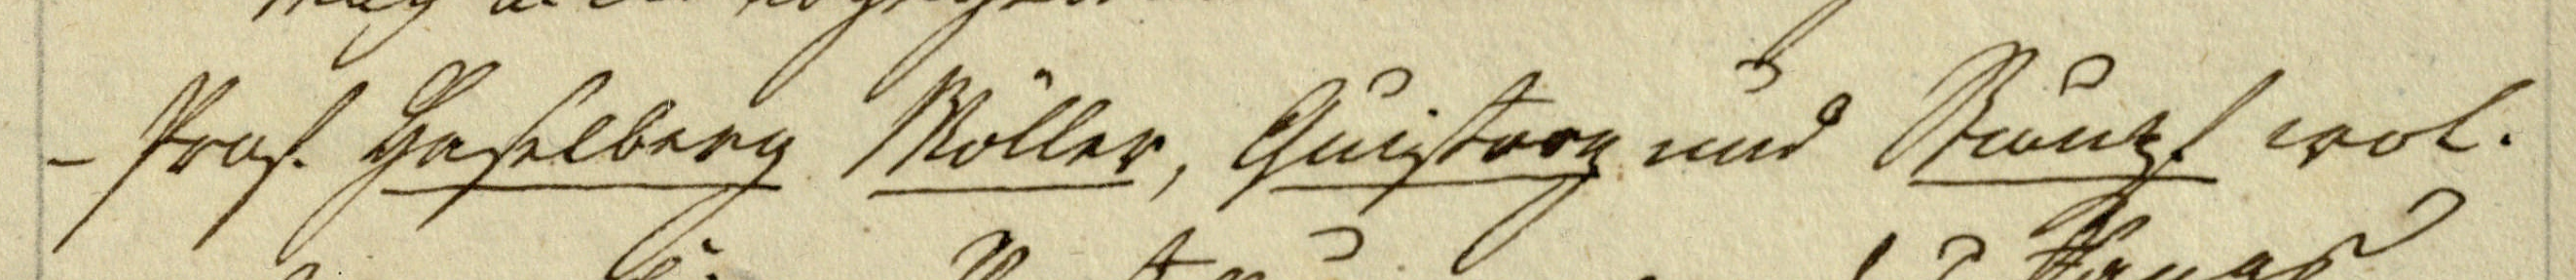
Prof. Haselberg Möller, Quistorp und Stumpf wol¬
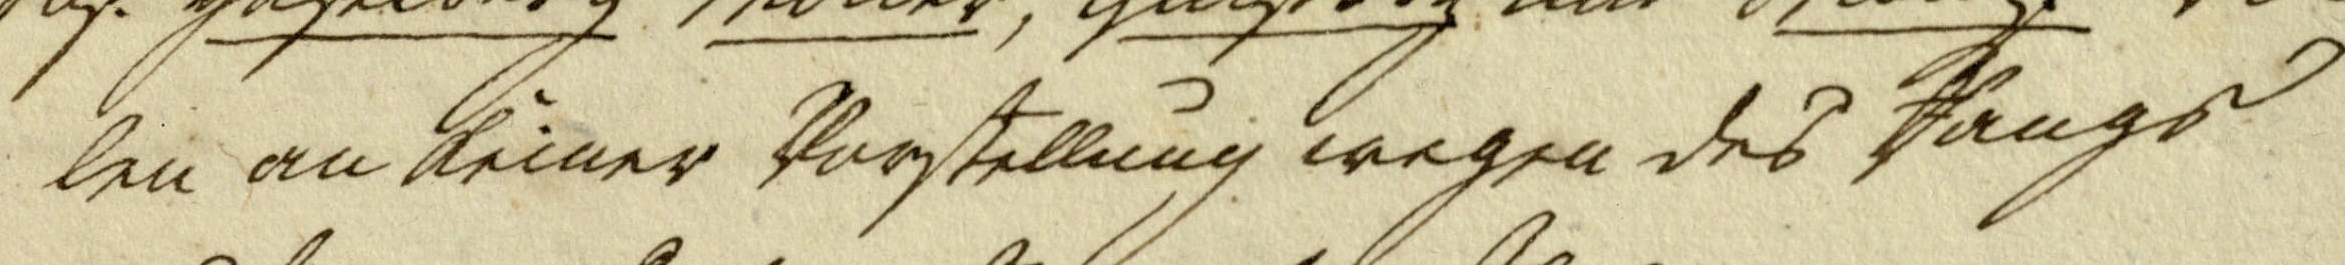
len an keiner Vorstellung wegen des Rangs
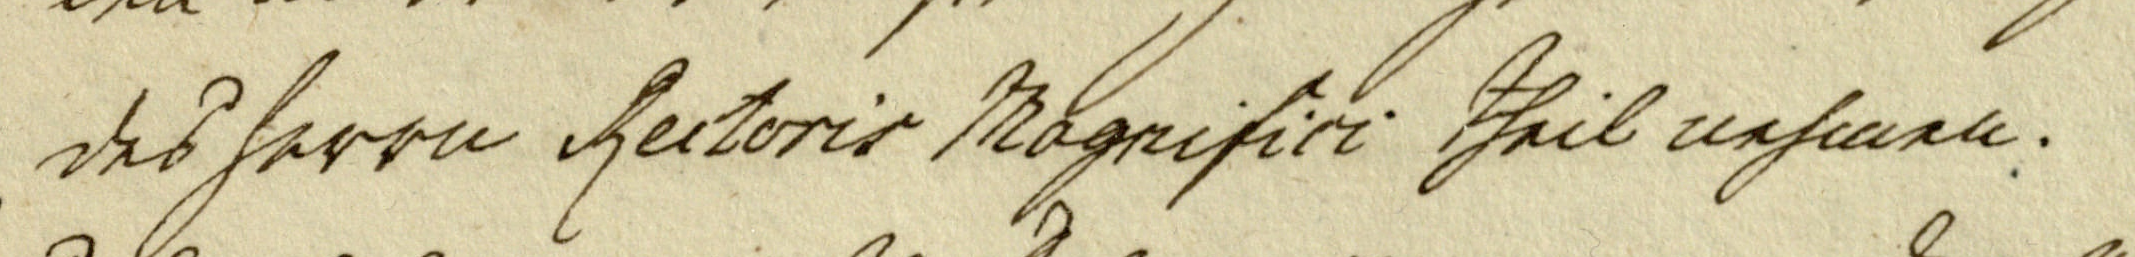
des Herrn Rectoris Magnifici Theil nehmen.
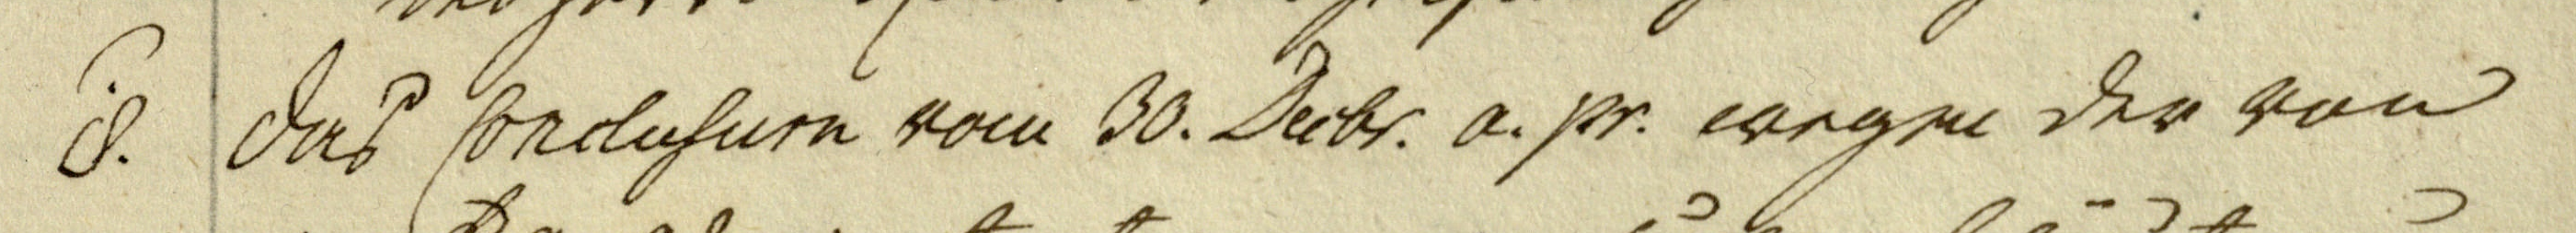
8. Da Conclusum vom 30. Decbr. a. pr. wegen der von
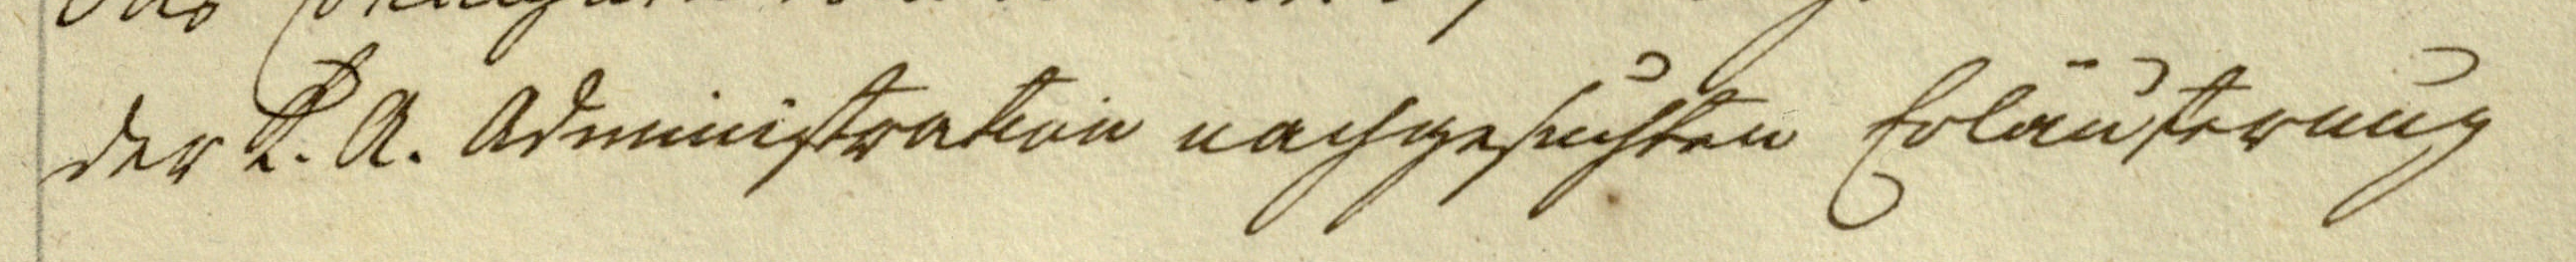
der K. A. Administration nachgesuchten Erläuterung
